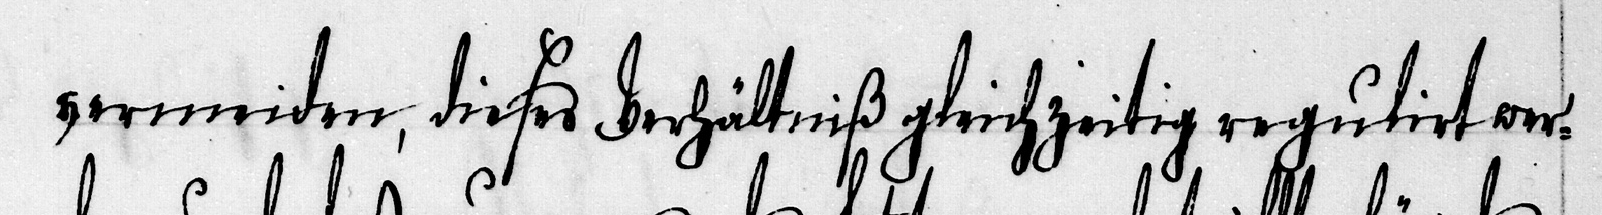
vermeiden, dieses Verhältniß gleichzeitig regulirt wer¬
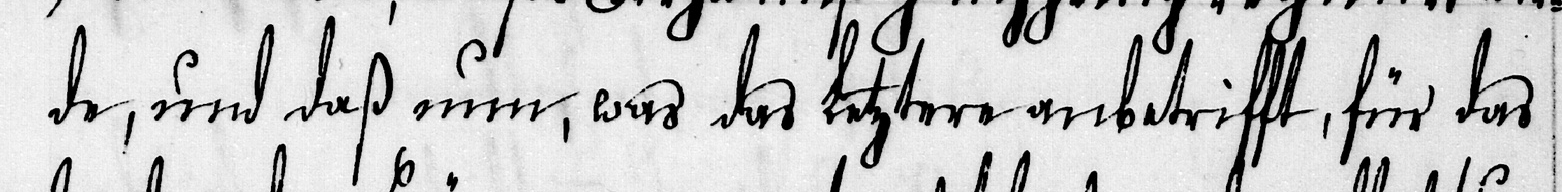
de, und daß nun, was das Letztere anbetrifft, für das
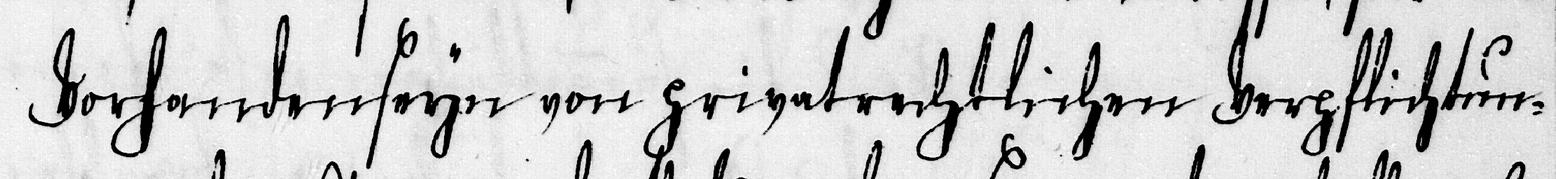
Vorhandenseyn von privatrechtlichen Verpflichtun¬
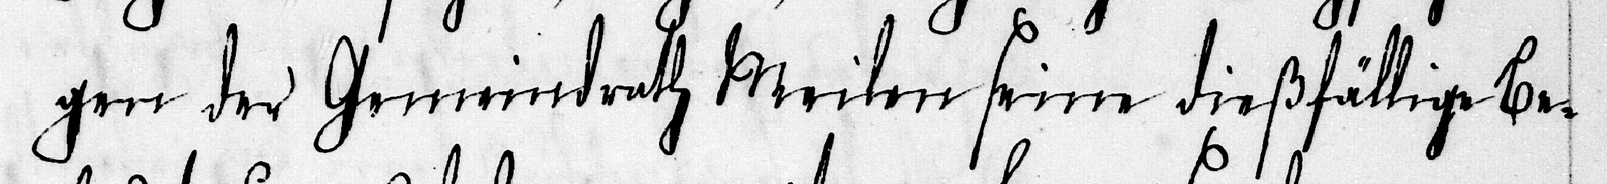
gen der Gemeindrath Meilen seine dießfällige Be¬
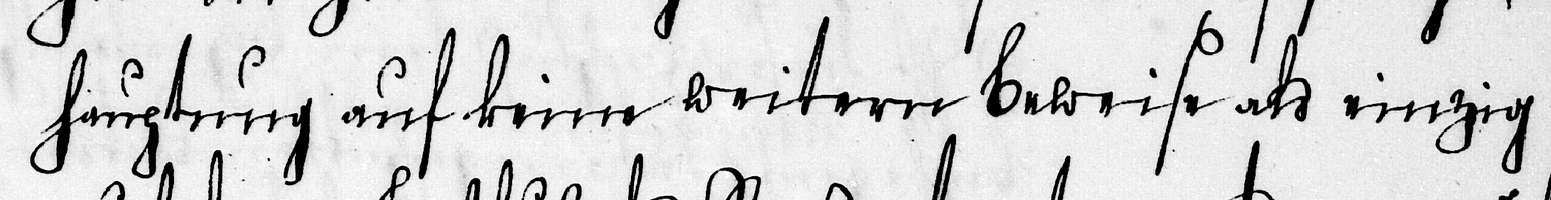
hauptung auf keine weitern Beweise als einzig
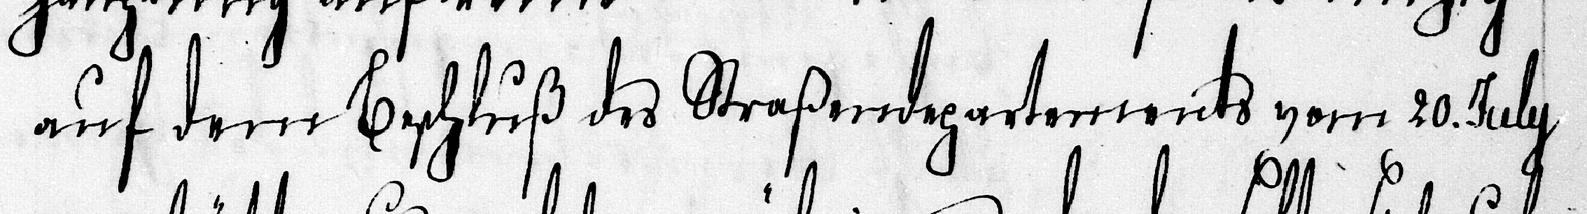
auf dem Beschluß des Straßendepartements vom 20. July
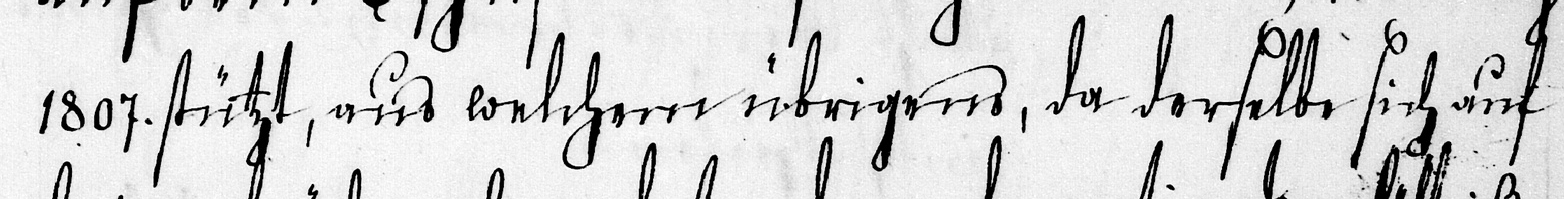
1807. stützt, aus welchem übrigens, da derselbe sich auf
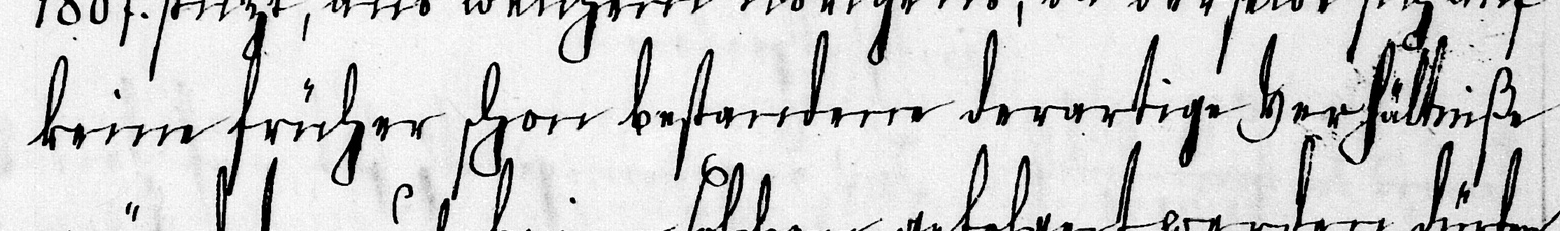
keine früher schon bestandene derartige Verhältniße
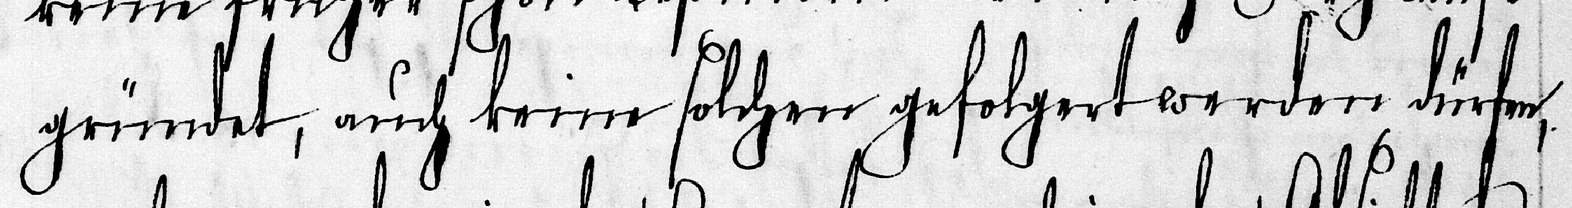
gründet, auch keine solchen gefolgert werden dürfen,
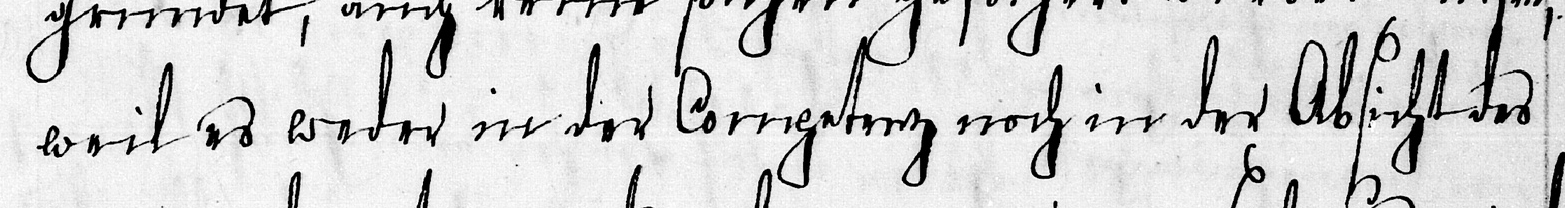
weil es weder in der Competenz noch in der Absicht des
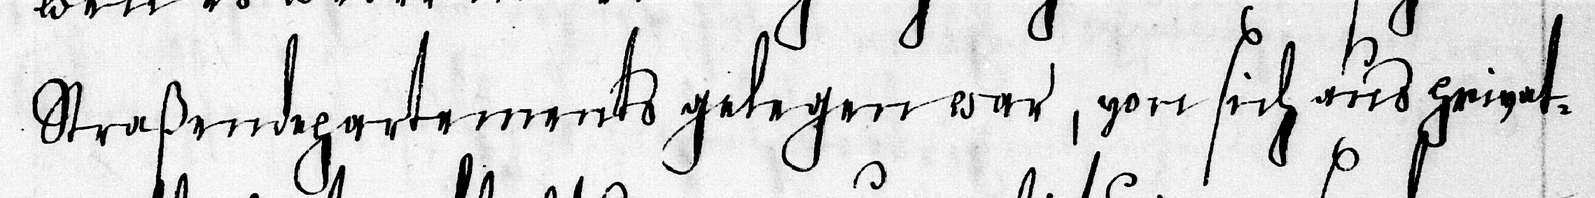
Straßendepartements gelegen war, von sich aus privat¬
